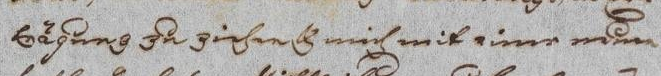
wägung zu ziehen & mich mit einer neuen
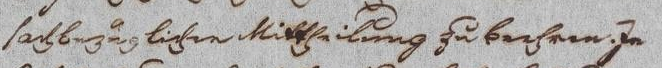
sachbezüglichen Mittheilung zu beehren. In
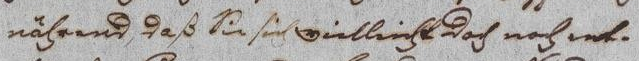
nährend, daß Sie sich vielleicht doch noch ent-
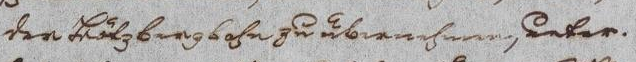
der Bötzbergbahn zu übernehmen, unter-
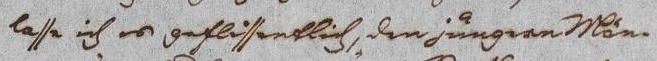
lasse ich es geflissentlich, den jüngern Män-
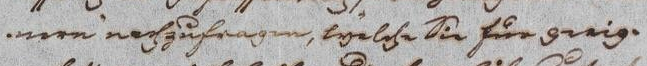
nern nachzufragen, welche sie für geeig-
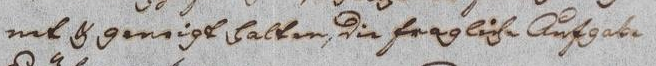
net & geneigt halten, die fragliche Aufgabe
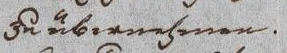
zu übernehmen.
